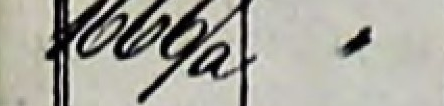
1666/a „
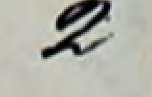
2
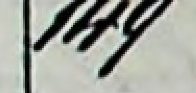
149
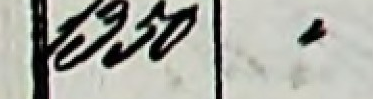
1350 „
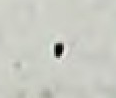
,
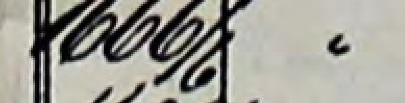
1666/b „
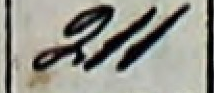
211
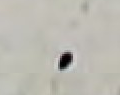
.
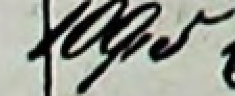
109,5
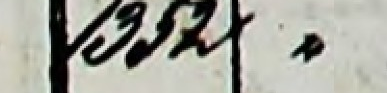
1352 „
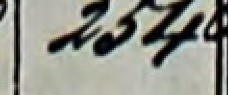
254
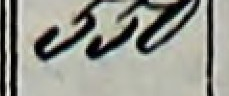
550
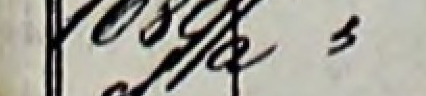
1689/a et „
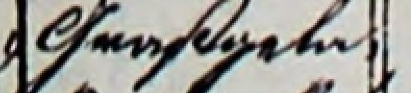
Graßgeta„
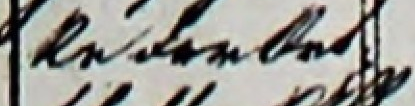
ke der Ort„
